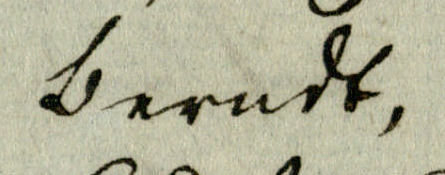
Berndt,
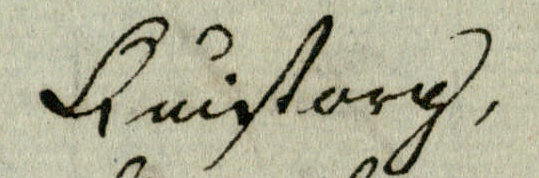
Quistorp,
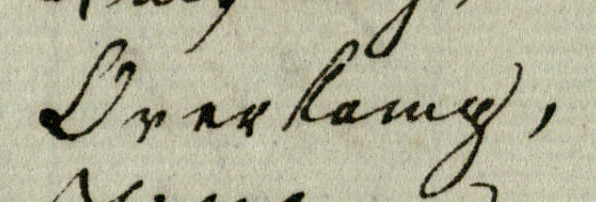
Overkamp,
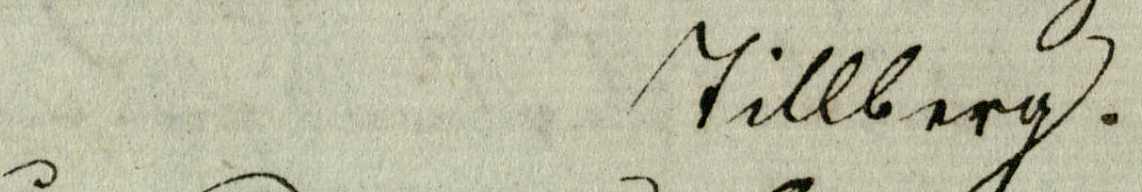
Tillberg.
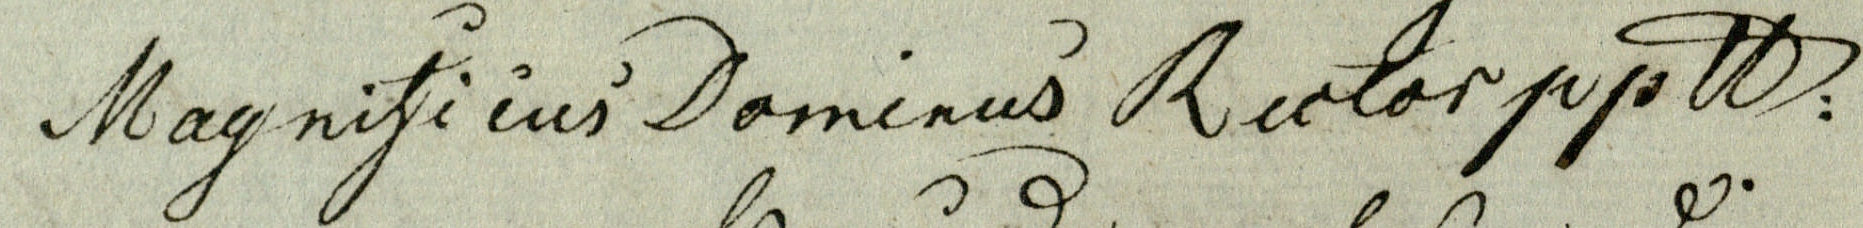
Magnificus Dominus Rector pp tt:
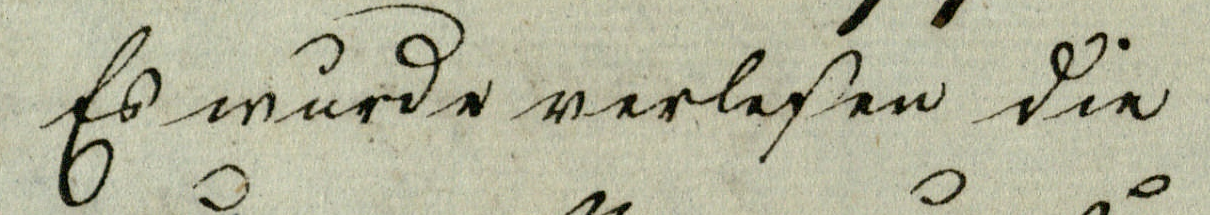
Es wurde verlesen die
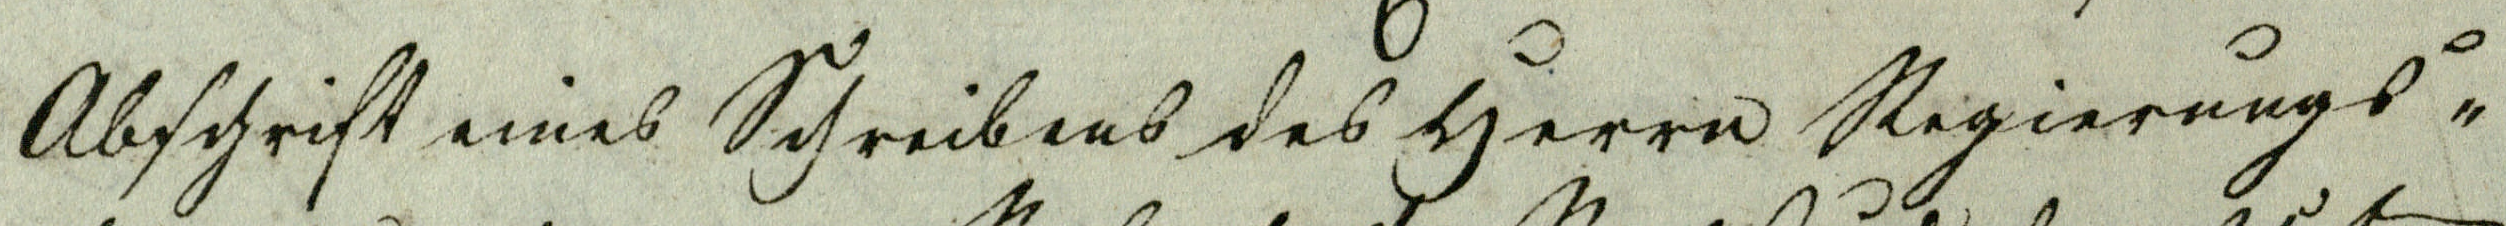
Abschrift eines Schreibens des Herrn Regierungs¬
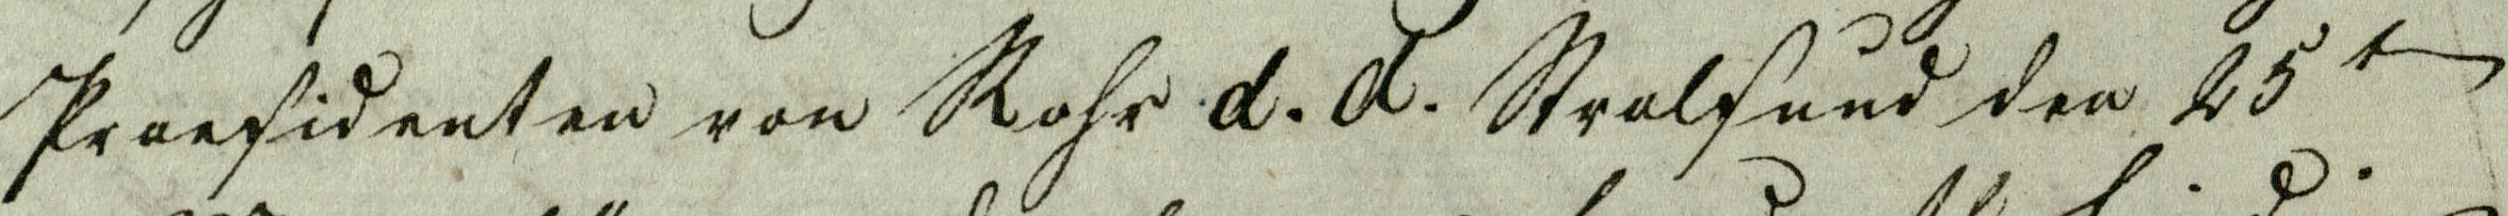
Praesidenten von Rohr d. d. Stralsund den 25ten
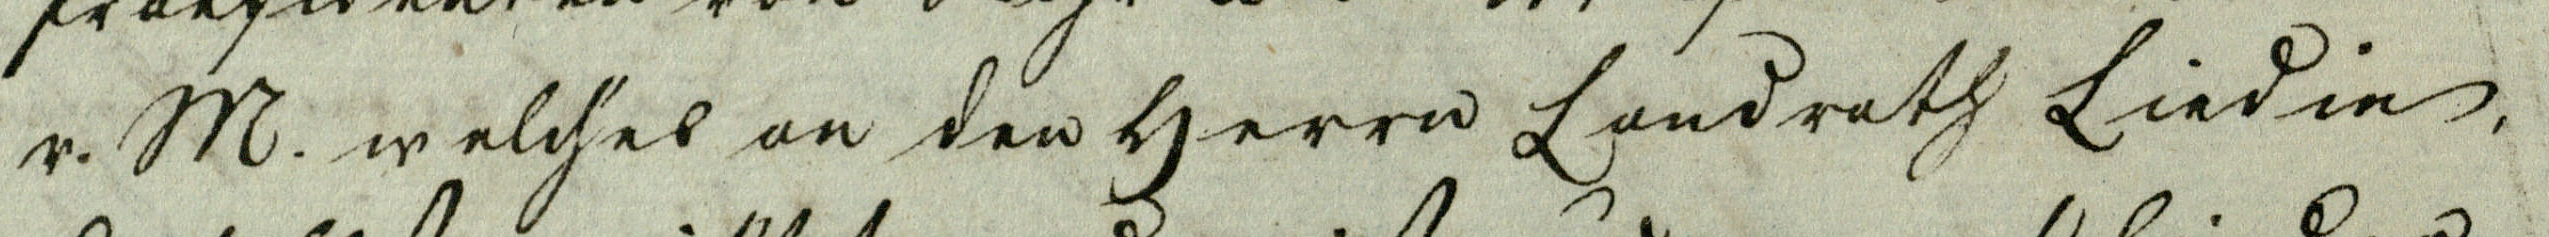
v. M. welches an den Herrn Landrath Liedin,
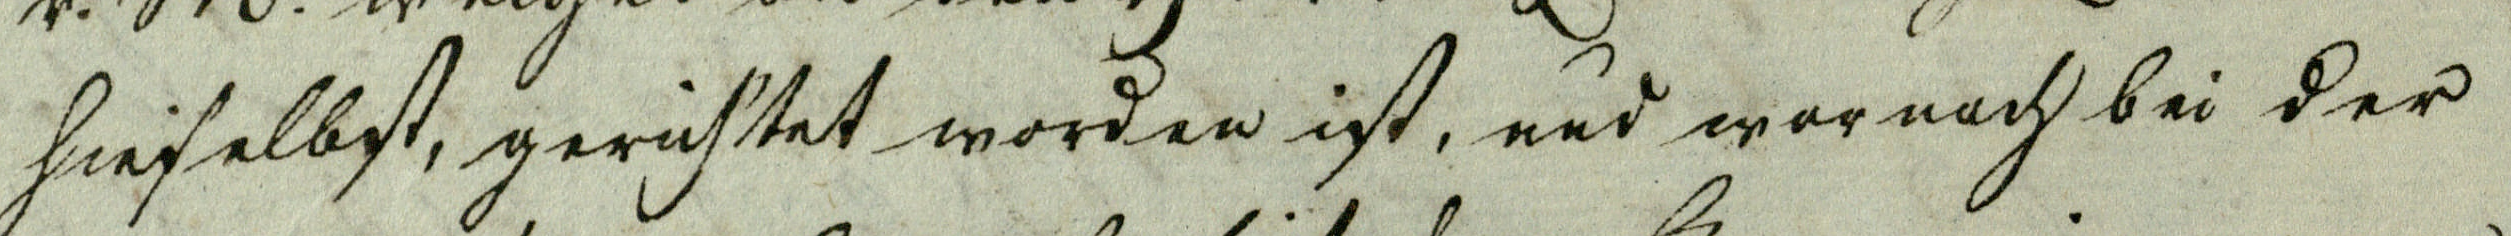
hieselbst, gerichtet worden ist, und wornach bei der
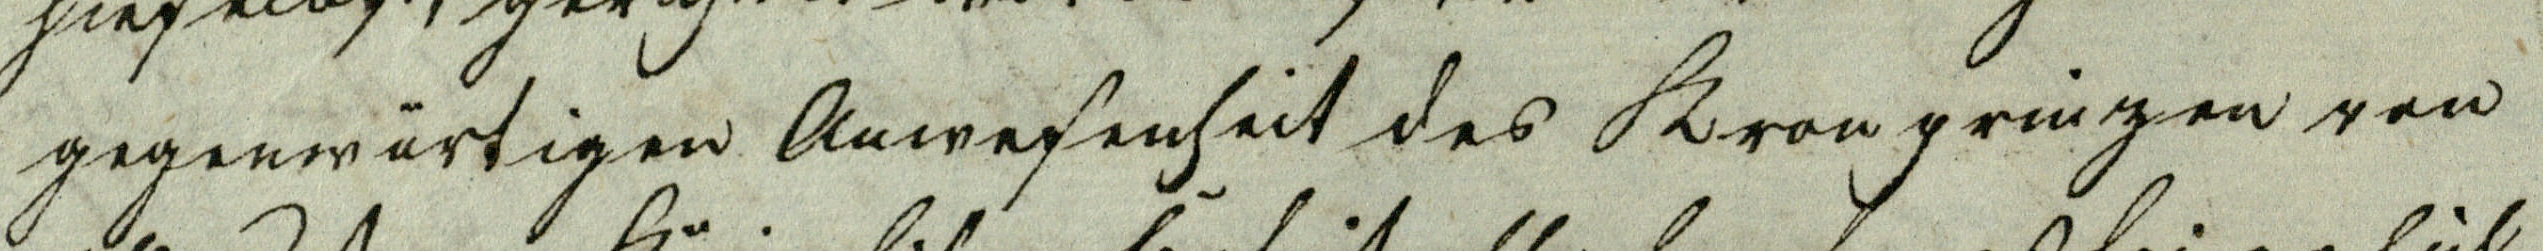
gegenwärtigen Anwesenheit des Kronprinzen von
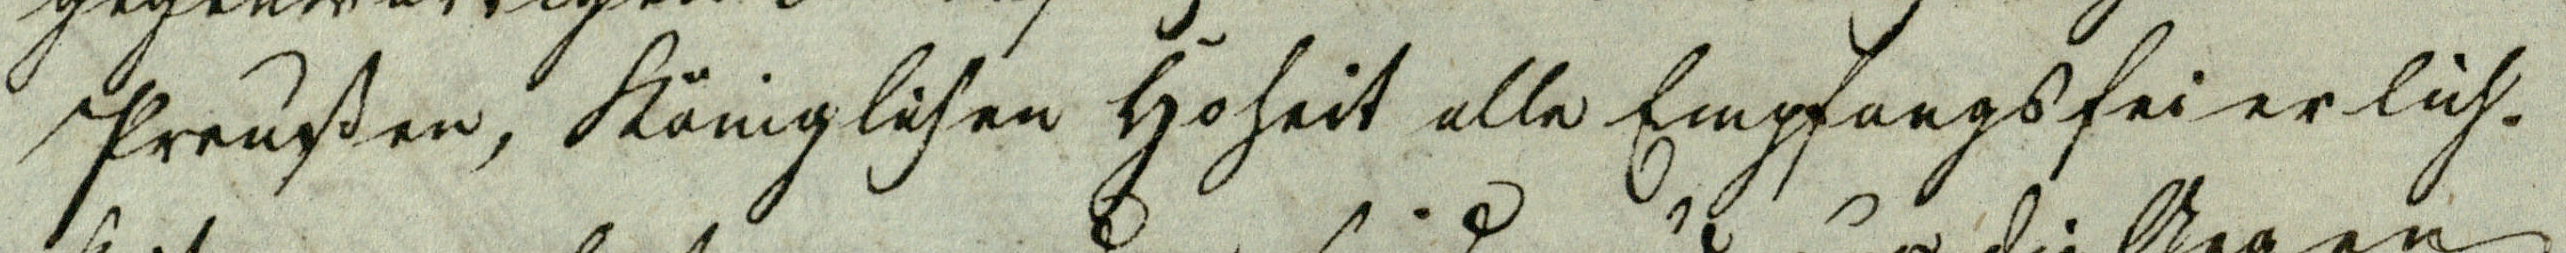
Preußen, Königlichen Hoheit Empfangsfeierlich¬
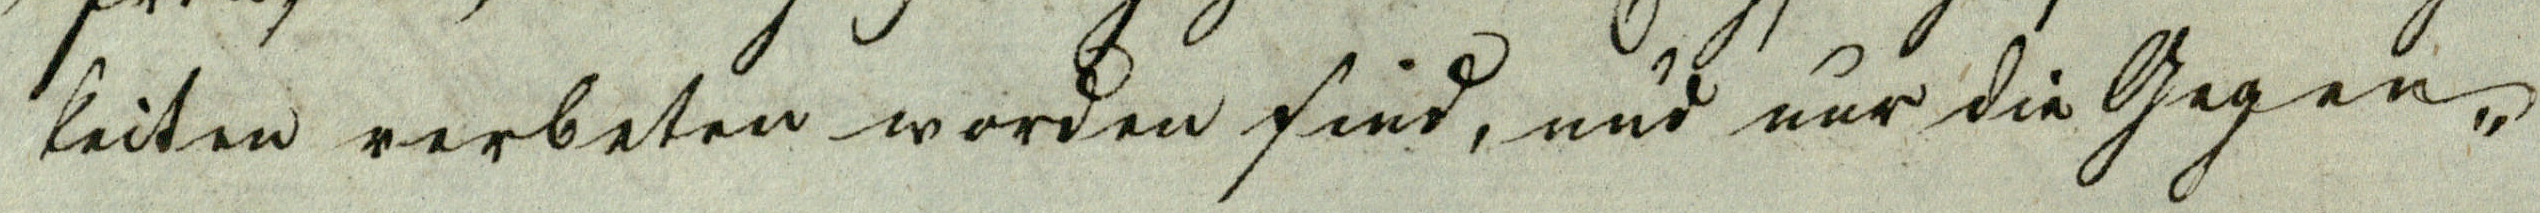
keiten verbeten worden sind, und nur die Gegen¬
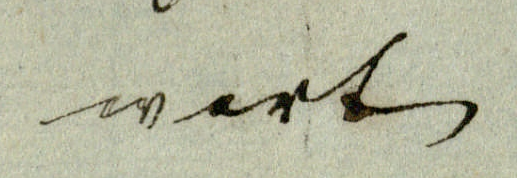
wart
